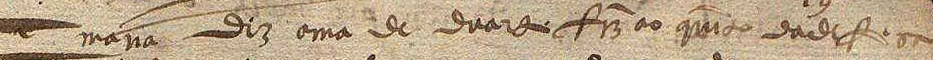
item maria diz ama de duarte fr̄z ao qūito da defesa
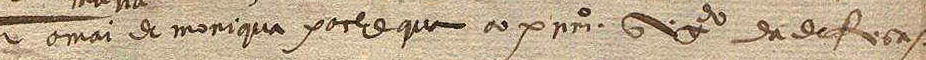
item a mai de moniqua pachequa ao primo. segdo da defesa /.
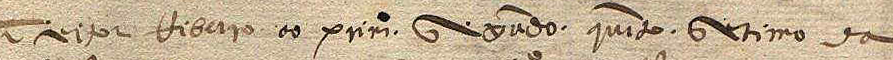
item eitor Ribeiro. ao primo. segūdo. q̄uito. setimo da
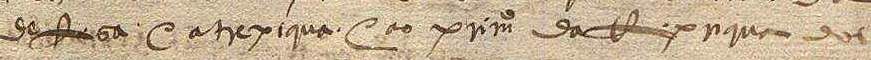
defesa e a trepiqua. e ao primo da Repriqua dos
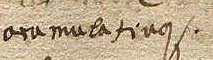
acumulatiuꝯ /.
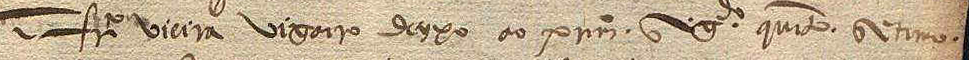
item frco vieira vigairo deyxo ao primo. segdo. qūito. setimo.
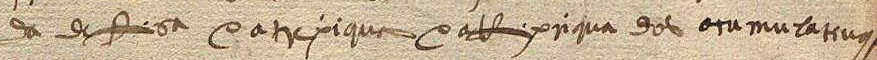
da defesa e a trepiqua e a Retriqua dos acumulatiuꝯ/
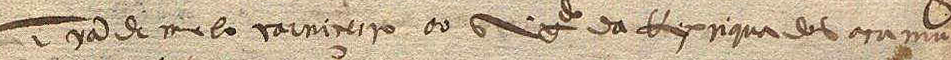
item yā de melo carniçeiro ao segdo da Repriqua dos acumu
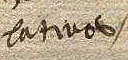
latiuos /.
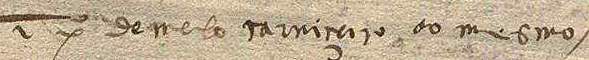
item po de melo carniçeiro ao mesmo /
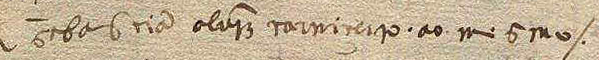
item sabastiā alur̄z carniçeiro. ao mesmo /.
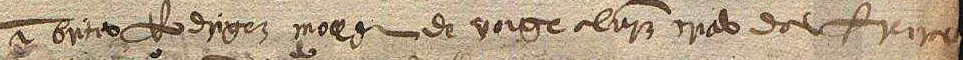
item brites Rodrigez molher de yorge alūrz criado das freiras
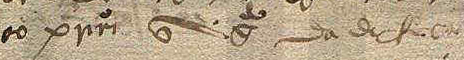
ao primo segdo da defesa
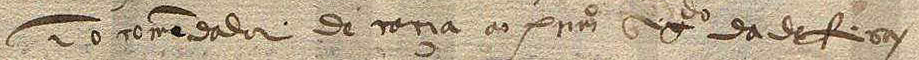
item o com̄edador. de caçia ao primo segdo da defesa /
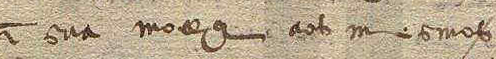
item sua molher aos mesmos/
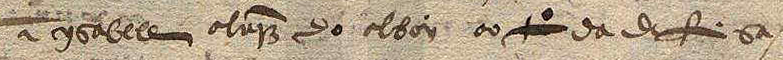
item ysabell alur̄z do alboy ao to da defesa/
